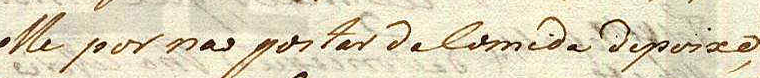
elle por nao gostar da Comida de peixe,
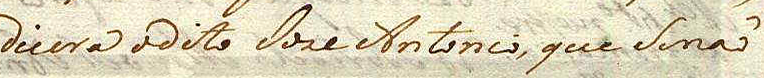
dicera o dito Ioze Antonio, que senaõ
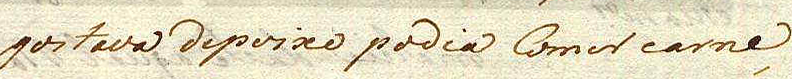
gostava de peixe podia Comer carne,
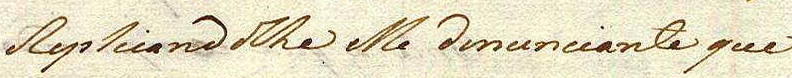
Replicandolhe elle denunciante que
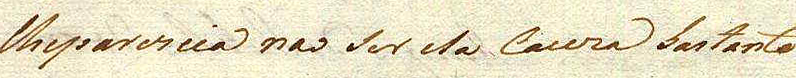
lhe parescia nao ser esa Cauza bastante
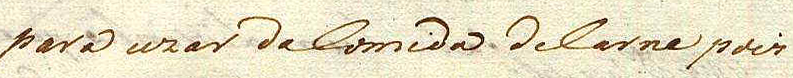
para uzar da Comida de Carne, pois
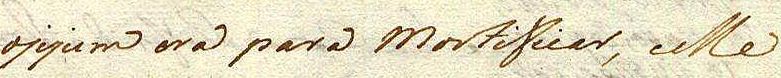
o jejum era para Mortificar, e elle
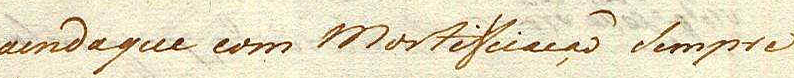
ainda que com Mortificaçaõ sempre
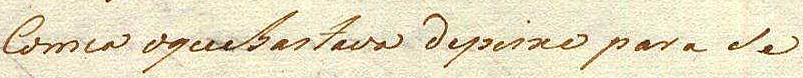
Comia o que bastava de peixe para se
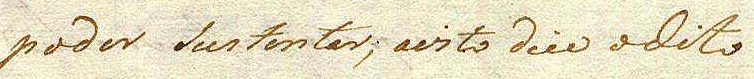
poder sustentar; a isto dice o dito
